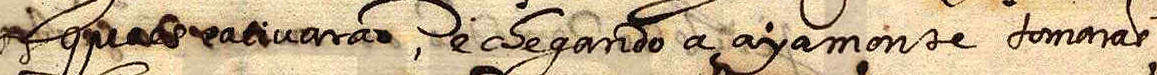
os quaes catiuaraõ, e chegando a ayamonte tomaraõ
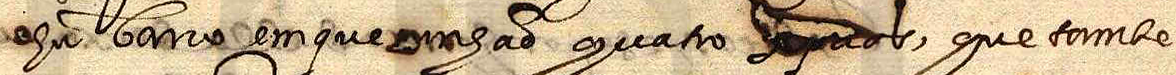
hū barco em que uinhaõ quatro xpaõs, que tambē
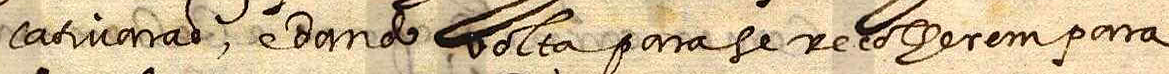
catiuaraõ, e dando volta para se recolherem para
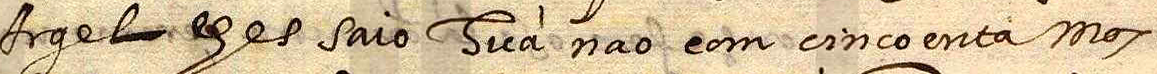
Argel lhes saio huā nao com cincoenta mos
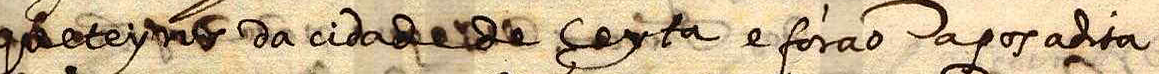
queteyros da cidade de Ceyta e foraõ apos a dita
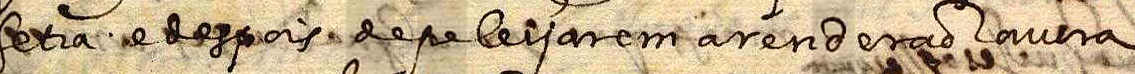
Setia e despois de peleijarem a renderaõ auera
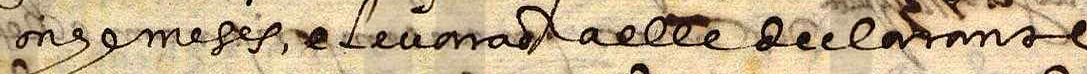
onze meses, e leuaraõ a elle declarante
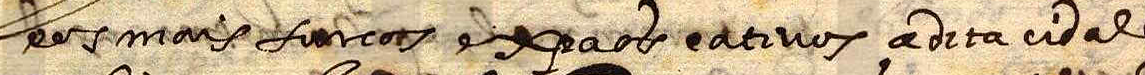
e os mais turcos e xpaõs catiuos a dita cidade
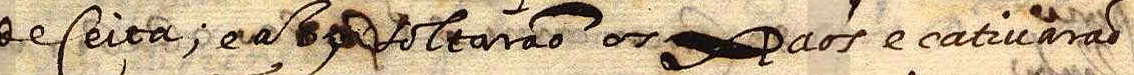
de Ceita; e ahy soltaraõ os xpaõs e catiuaraõ
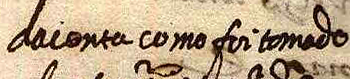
da conta como foi tomado
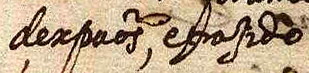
de xpaõs, e trazido
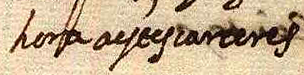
hora a estes carceres
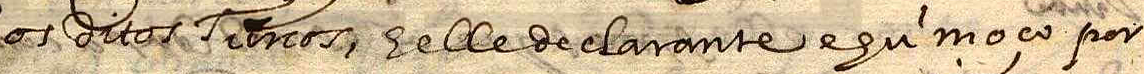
os ditos Turcos, E elle declarante e hū moço por
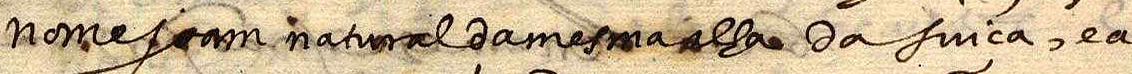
nome joam natural da mesma ilha da Iuiça, e a
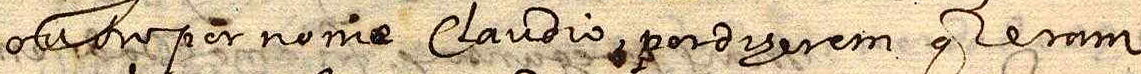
outro por nome Claudio, por dizerem q̄ eram
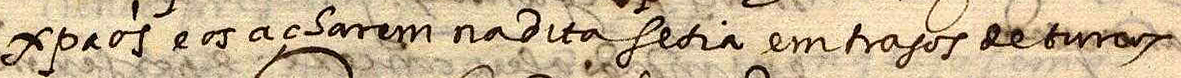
xpaõs e os acharem na dita Setia em trajos de turcos
